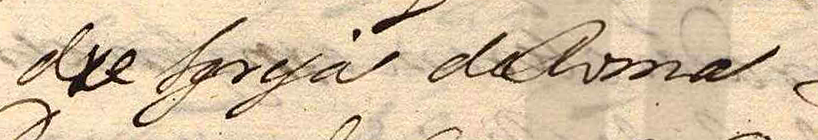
dre Igreja de Roma
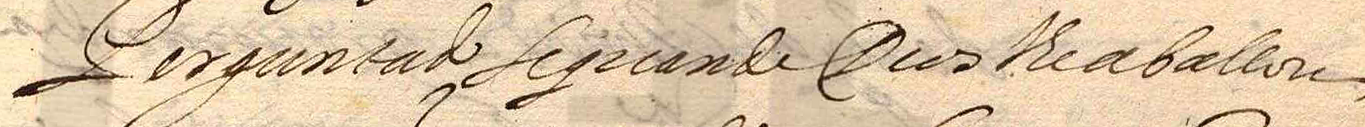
Perguntado se quando Deos lhe aballou
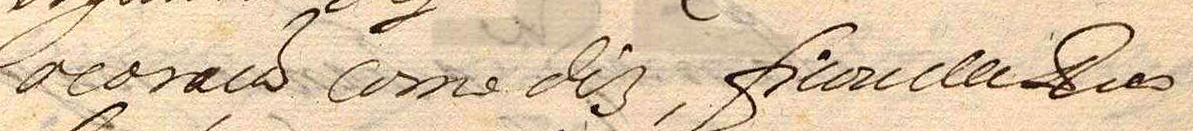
o coração como diz, ficou elle Reo
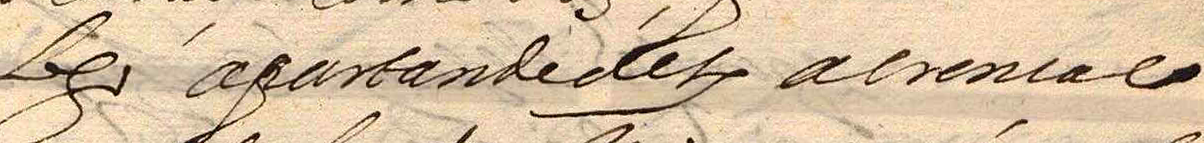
logo apartando de sy a crença e
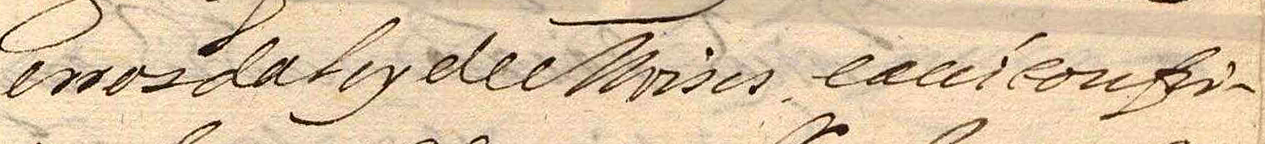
erros da ley de Moises, e aceitou fir
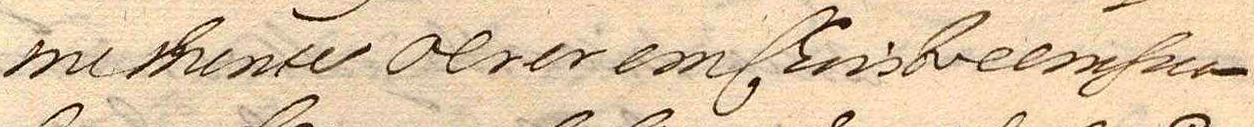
memente o crer em Christo e em sua
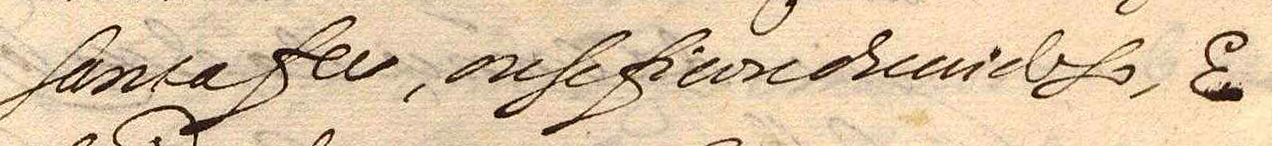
santa fee, ou se ficou duuidoso, E
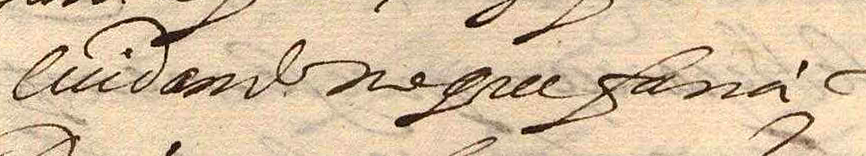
cuidando no que faria
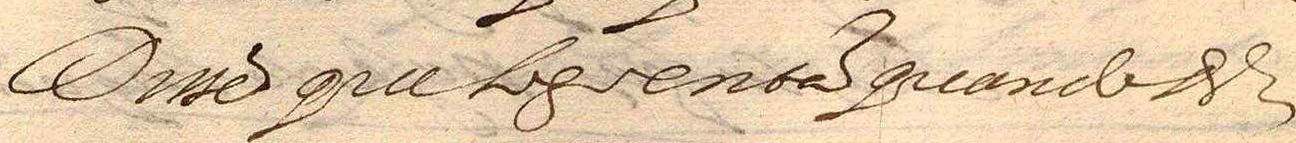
Disse que logo entaõ quando Ds̄
